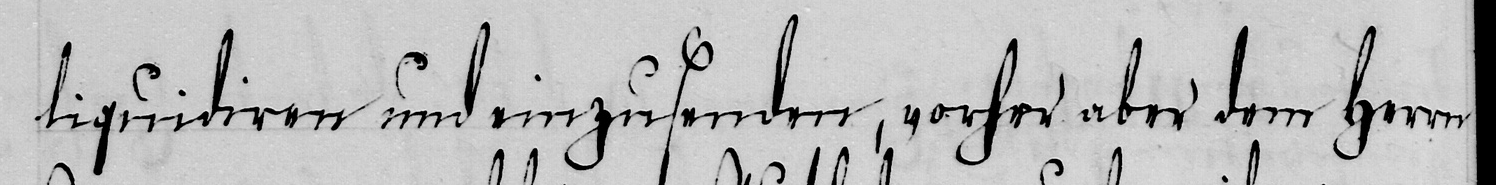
liquidiren und einzusenden, vorher aber dem Herrn
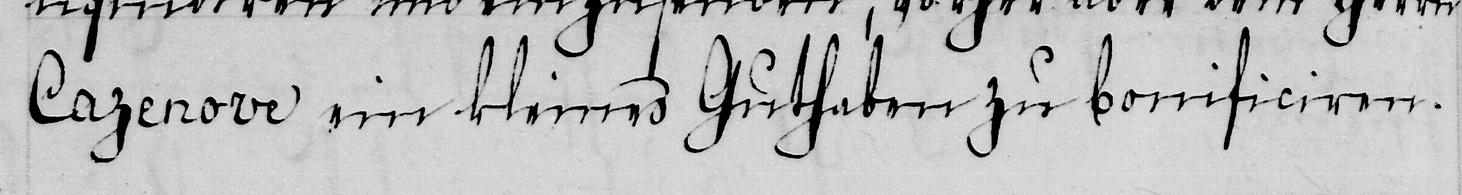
Cazenove ein kleines Guthaben zu bonificiren.
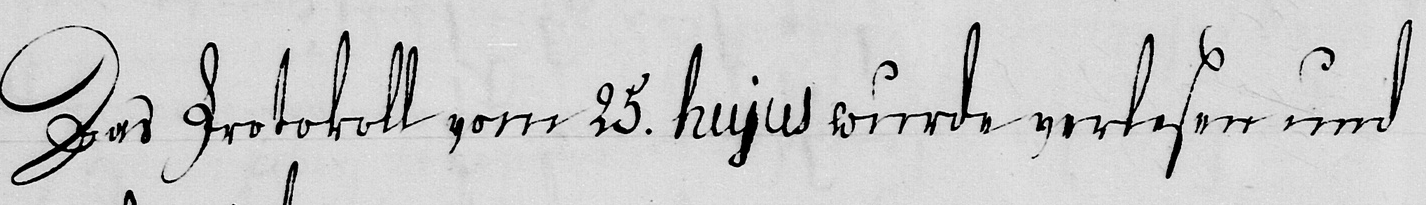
Das Protokoll vom 25. hujus wurde verlesen und
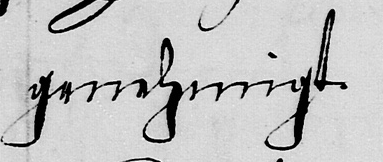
genehmigt.
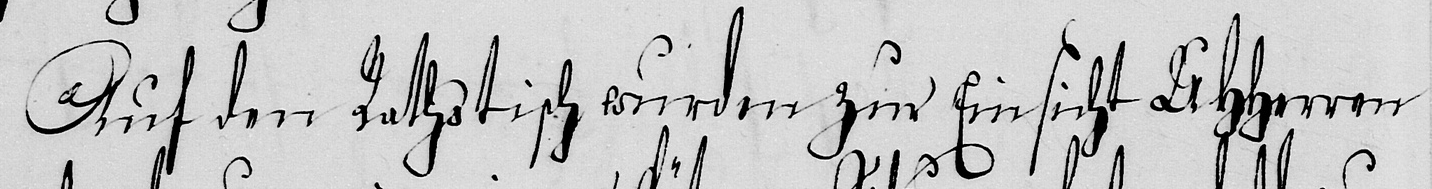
Auf den Rathstisch wurden zur Einsicht UHHerren
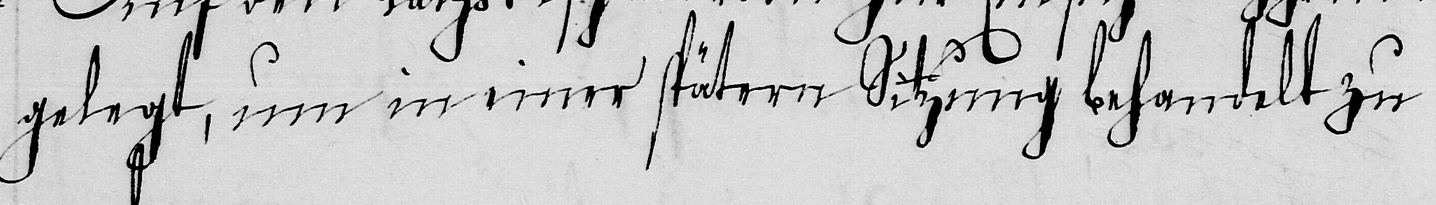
gelegt, um in einer spätern Sitzung behandelt zu
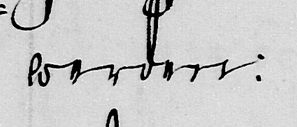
werden:
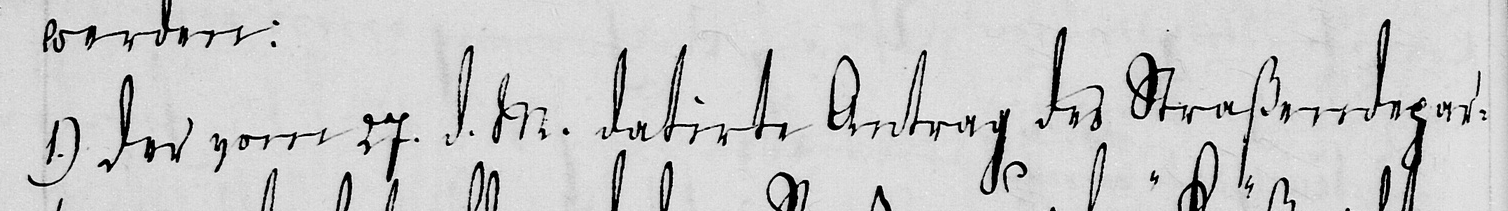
1.) der vom 27. d. M. datirte Antrag des Straßendepar¬
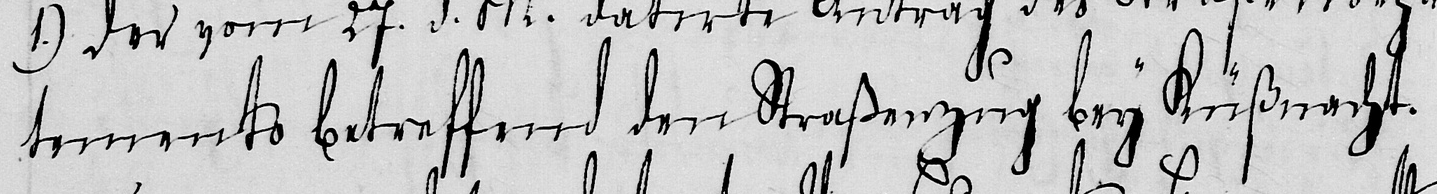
tements betreffend den Straßenzug bey Küßnacht.
